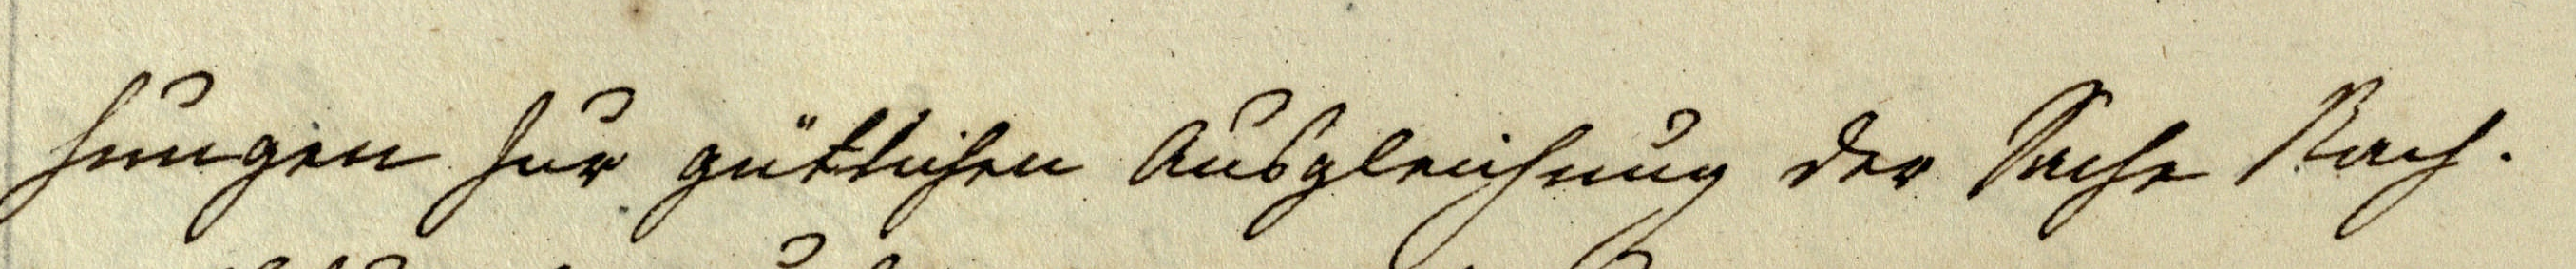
hungen zur gütlichen Ausgleichung der Sache Nach¬
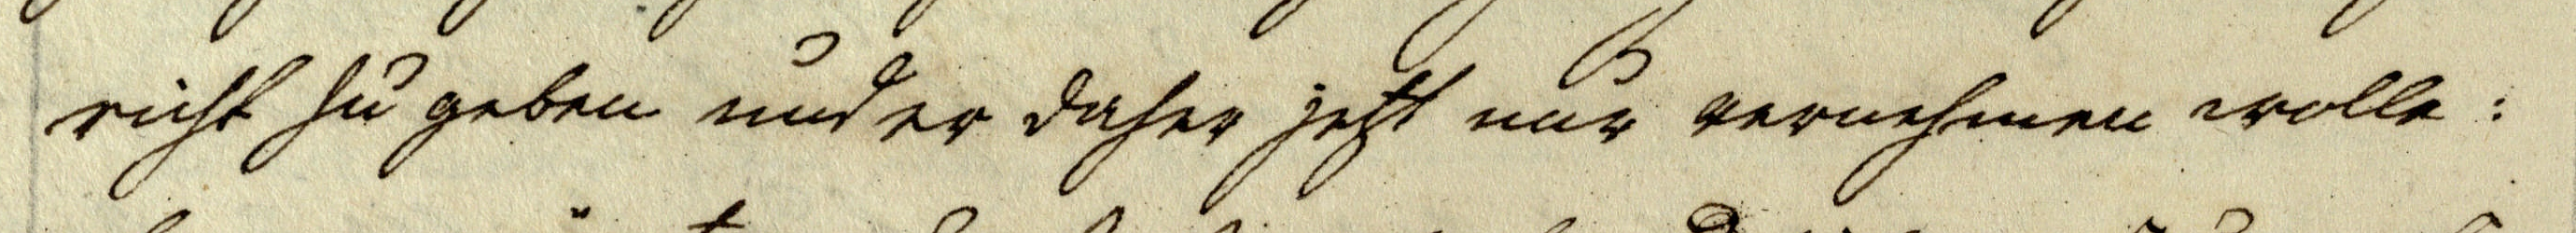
richt zu geben und er daher jetzt nur vernehmen wolle:
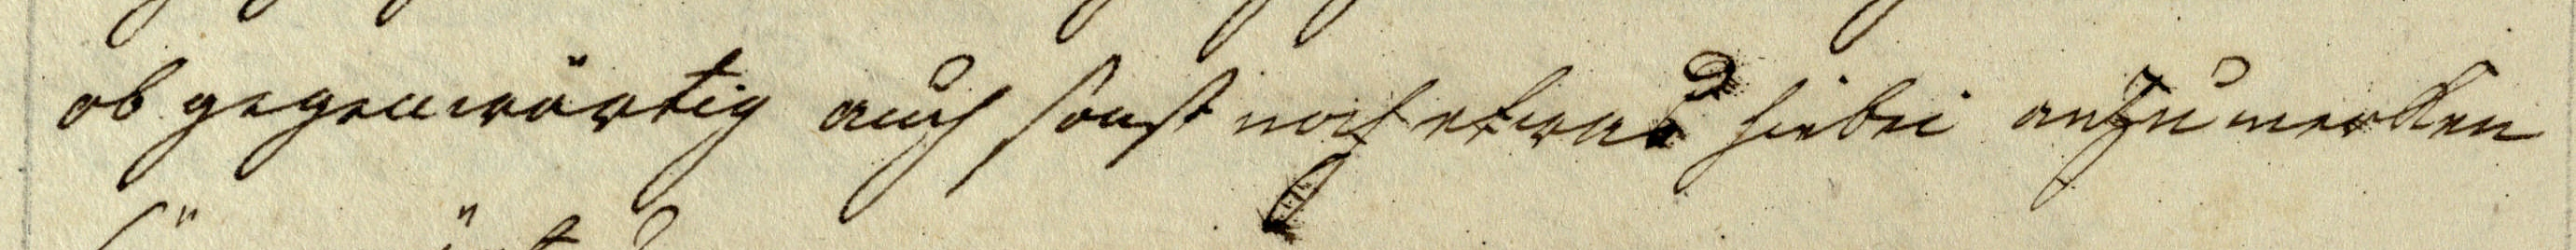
ob gegenwärtig auch sonst noch etwas hiebei anzumerken
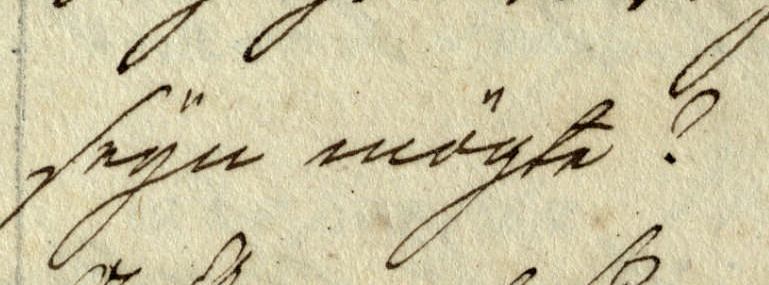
seÿn mögte?
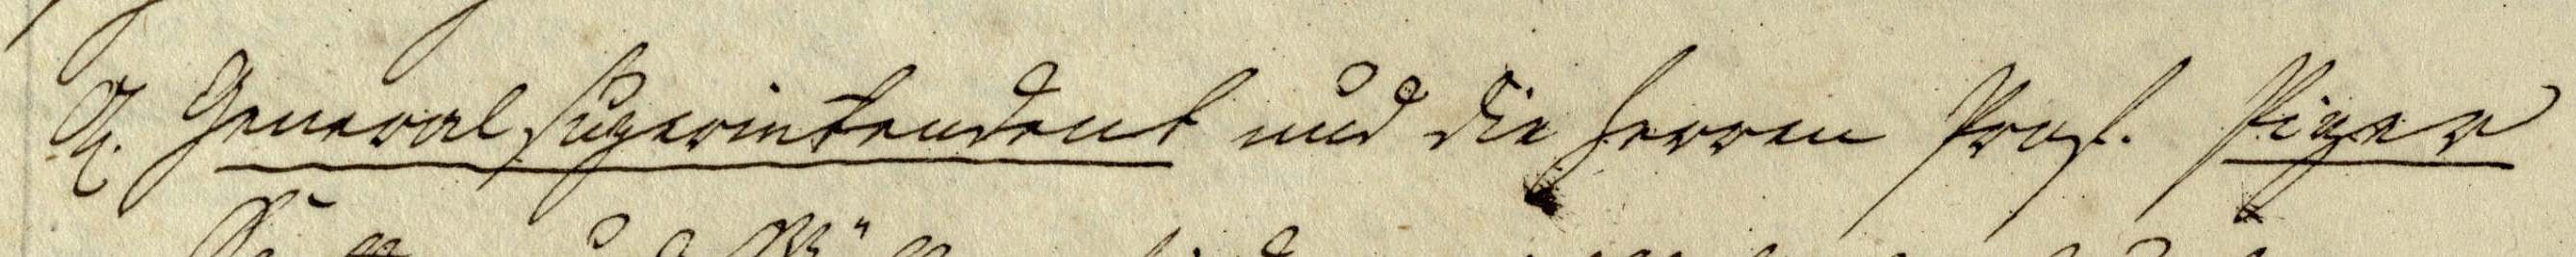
dh. Generalsuperintendent und die Herren Prof. Piper
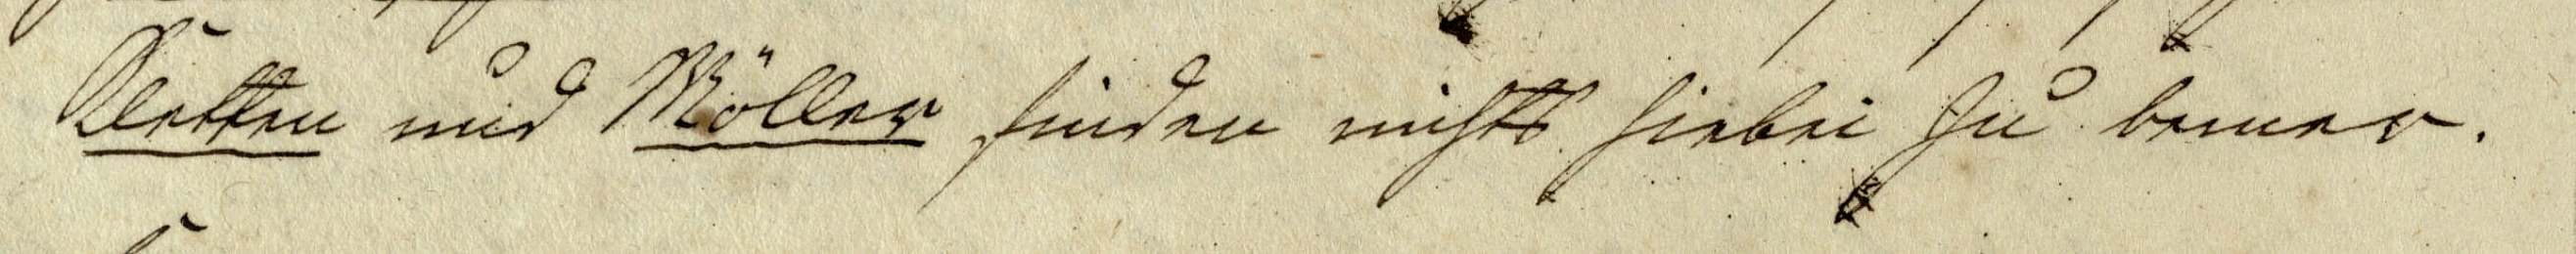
Kletten und Möller finden nichts hiebei zu bemer¬
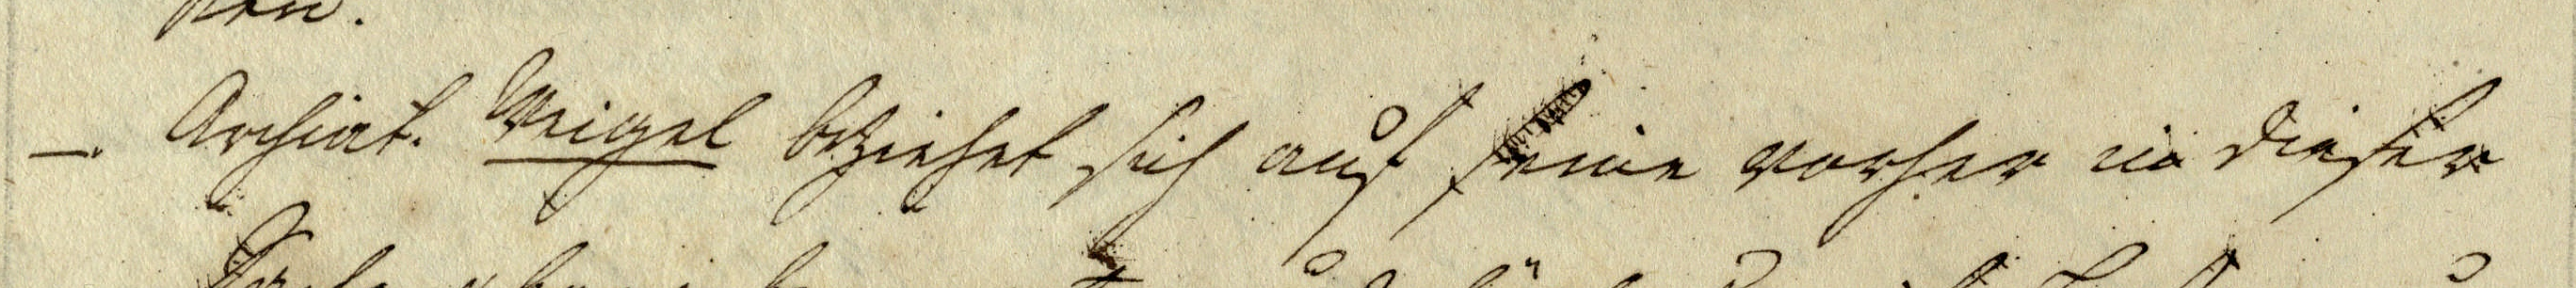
Archiat. Weigel beziehet sich auf seine vorher in dieser
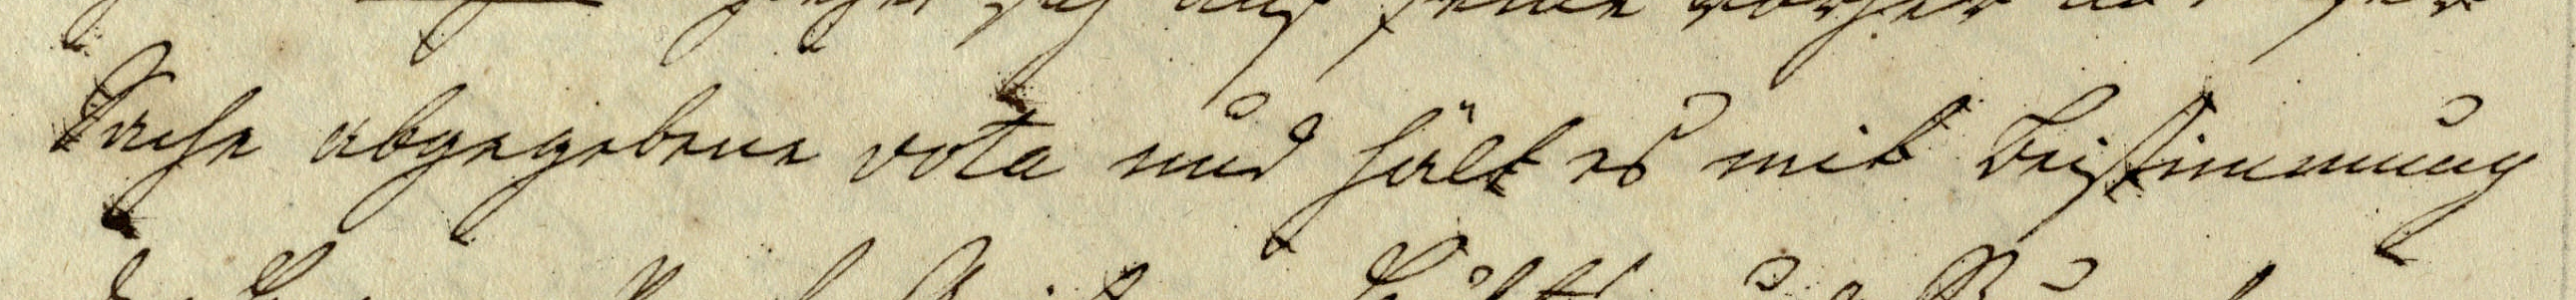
Sache abgegebene vota und hält es mit Beistimmung
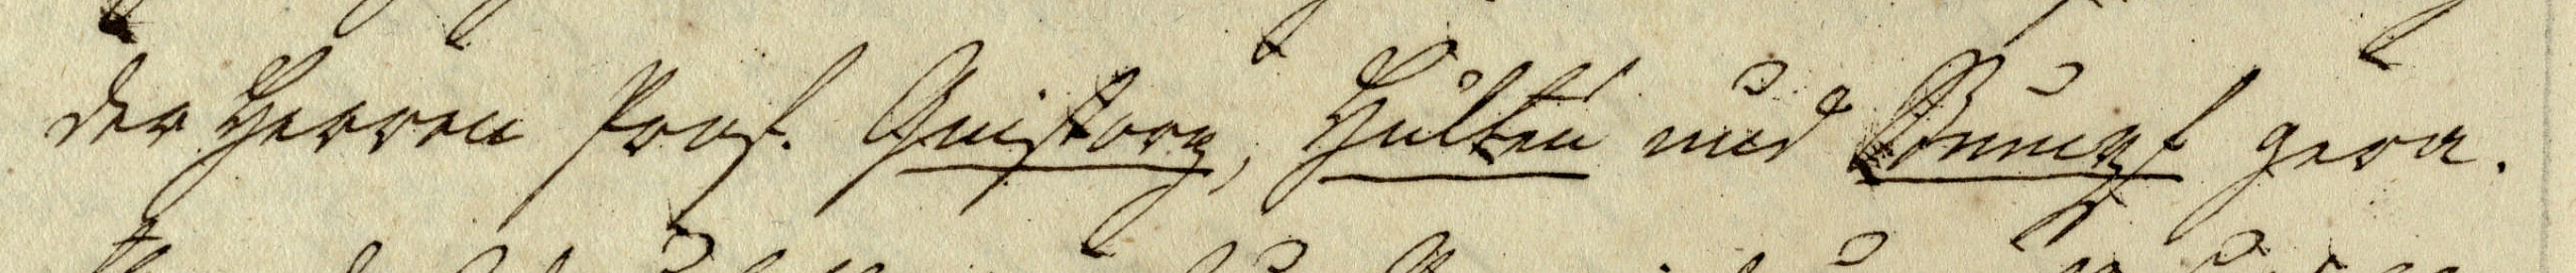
der Herren Prof. Quistorp, Hultén und Stumpf gera¬
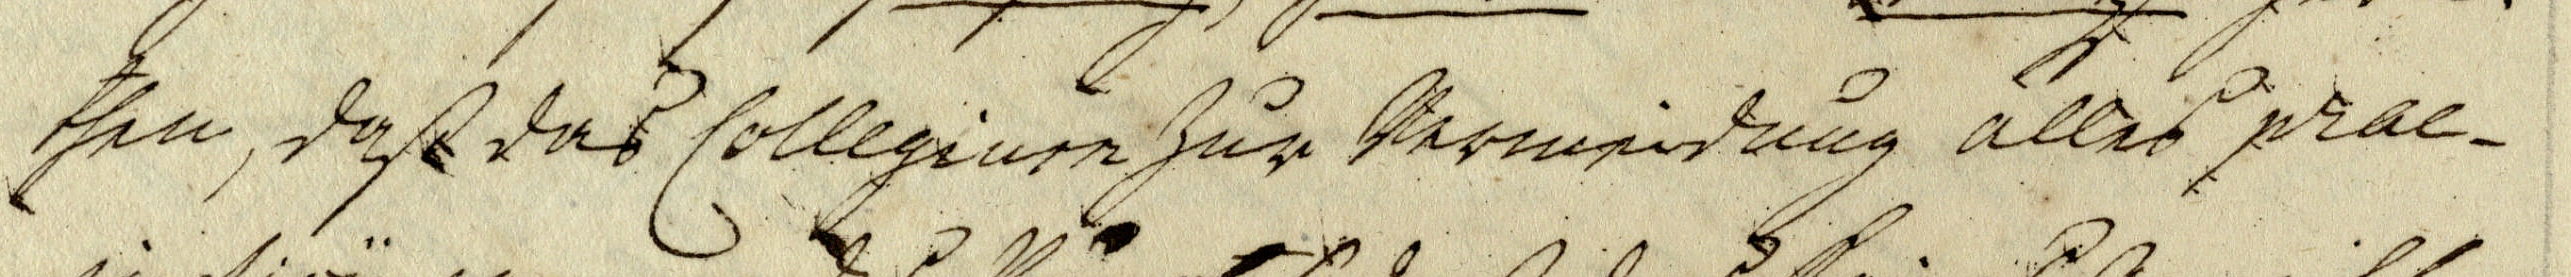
then, daß das Collegium zur Vermeidung alles prae¬
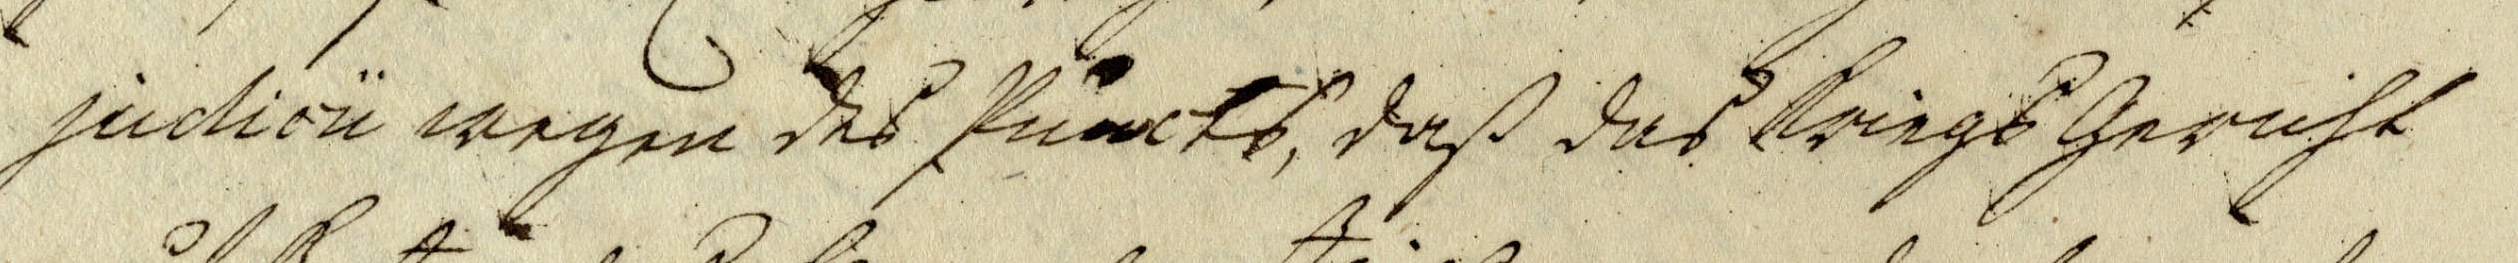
judicii wegen des Puncts, daß das KriegsGericht
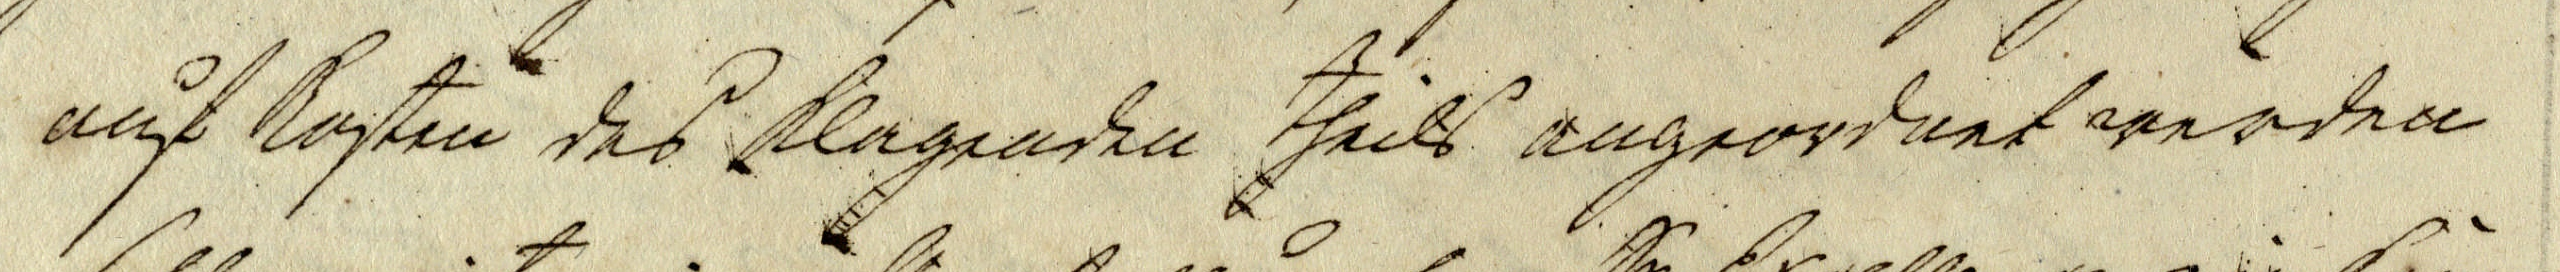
auf Kosten des Klagenden theils angeordnet werden
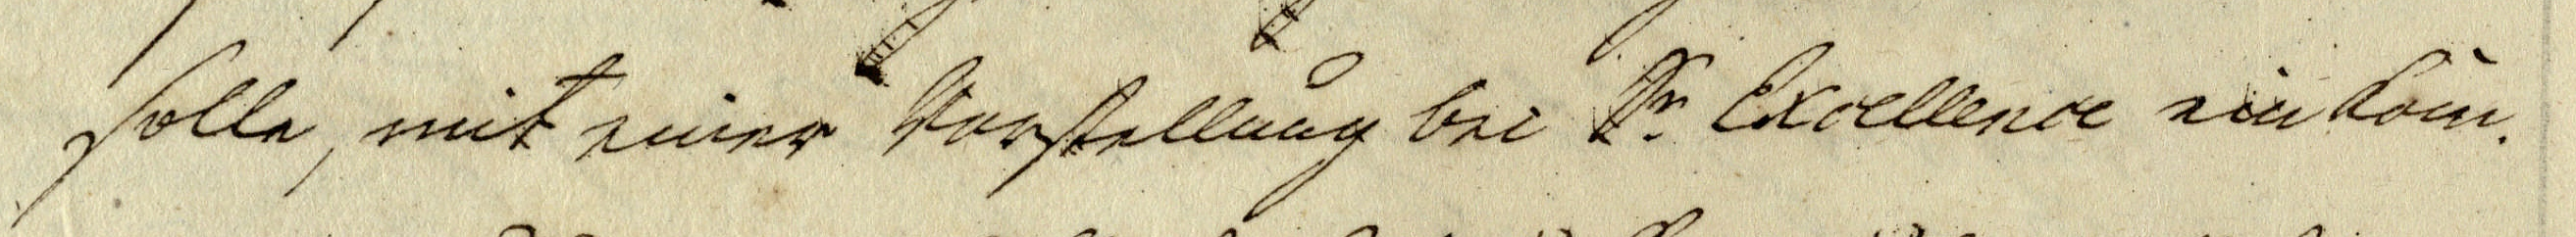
solle, mit einer Vorstellung bei Sr Excellence einkom¬
